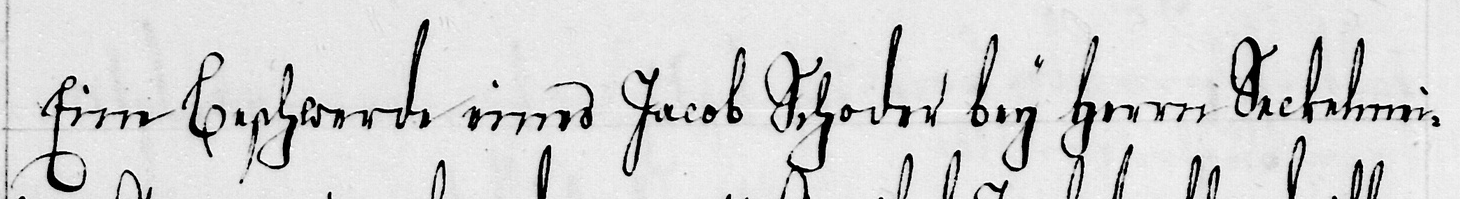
Eine Beschwerde eines Jacob Schoder bey Herrn Seckelmei¬
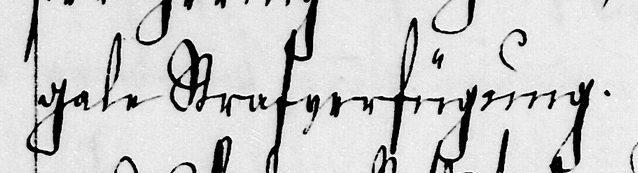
egale Strafverfügung.
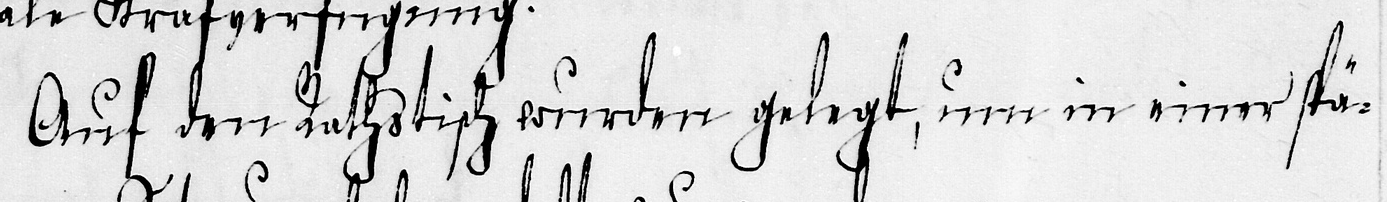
Auf den Rathstisch wurden gelegt, um in einer spä¬
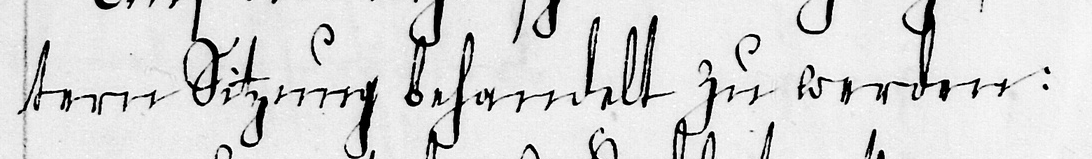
tern Sitzung behandelt zu werden:
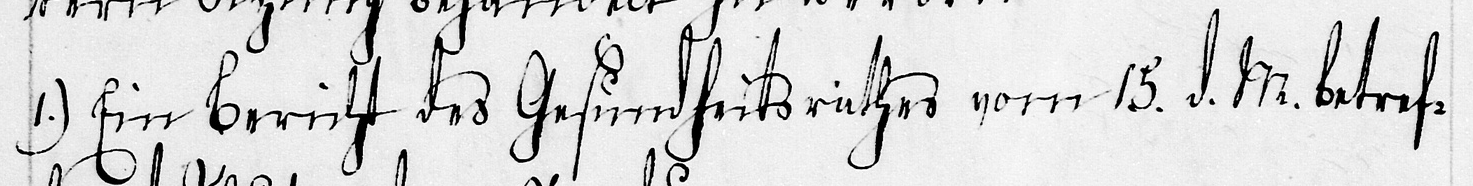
1.) Ein Bericht des Gesundheitsrathes vom 15. d. M. betref¬
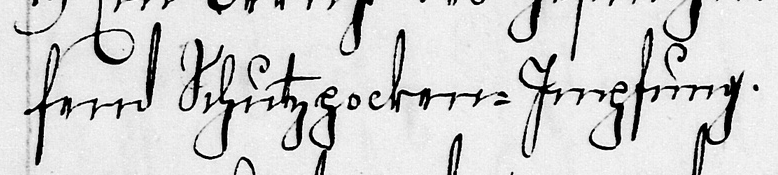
fend Schotzpocken-Impfung.
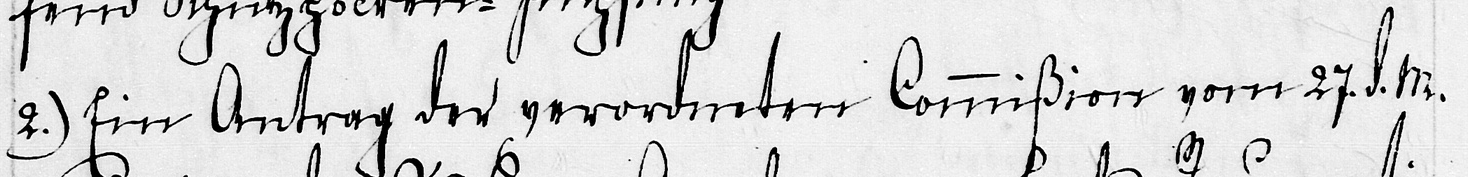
2.) Ein Antrag der verordneten Commißion vom 27. d. M.
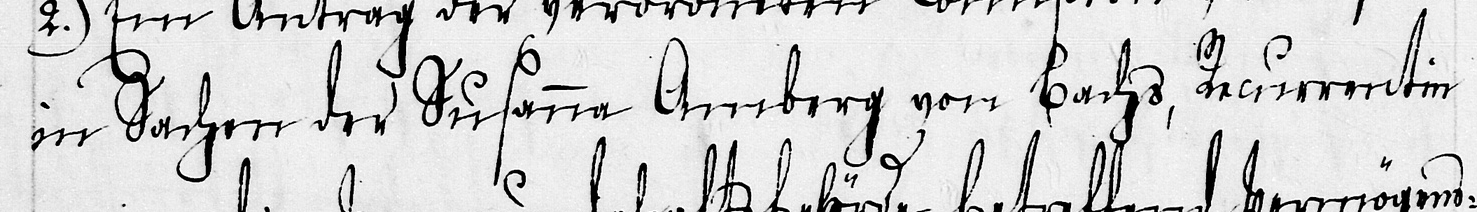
in Sachen der Susanna Amberg von Bachs, Recurrentin
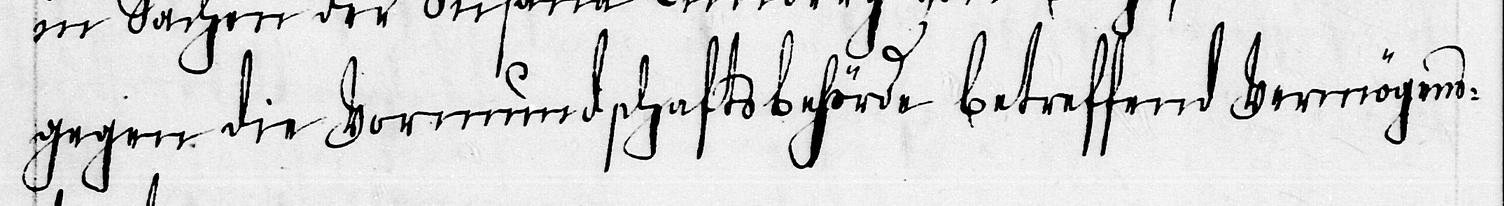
gegen die Vormundschaftsbehörde betreffend Vermögen¬
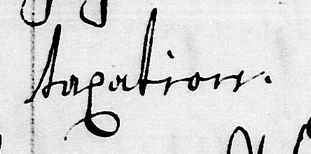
staxation.
